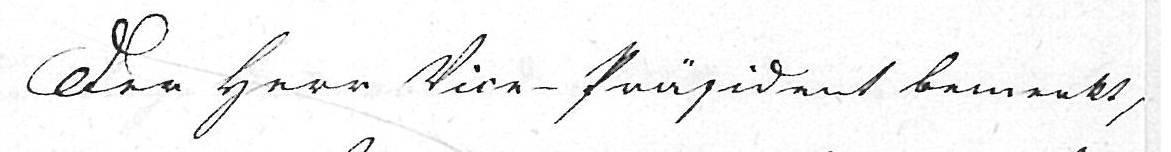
Der Herr Vice-Präsident bemerkt,
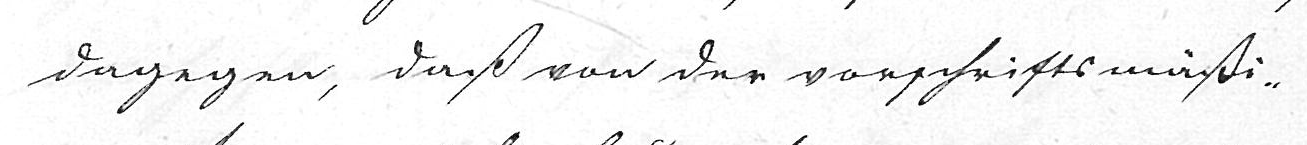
dagegen, daß von der vorschriftsmäßi-
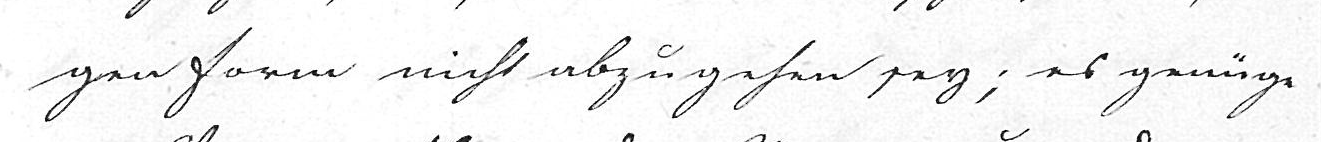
gen Form nicht abzugehen sey; es genüge
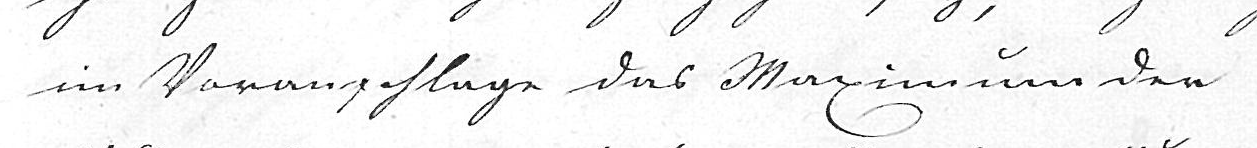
im Voranschlage das Maximum der
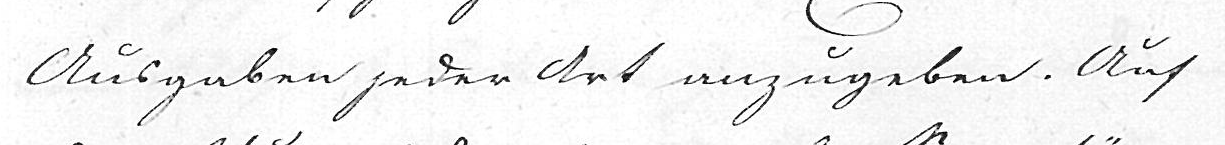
Ausgaben jeder Art anzugeben. Auf
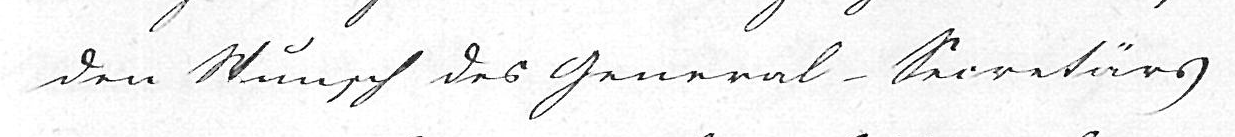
den Wunsch des General-Secretärs
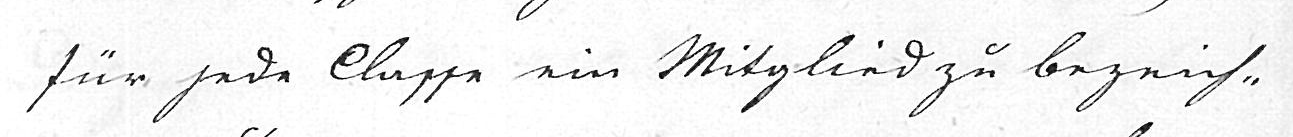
für jede Classe ein Mitglied zu bezeich-
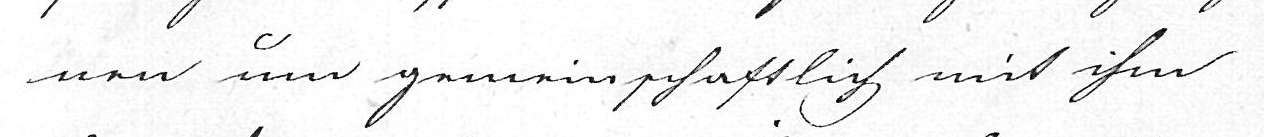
nen nun gemeinschaftlich mit ihm
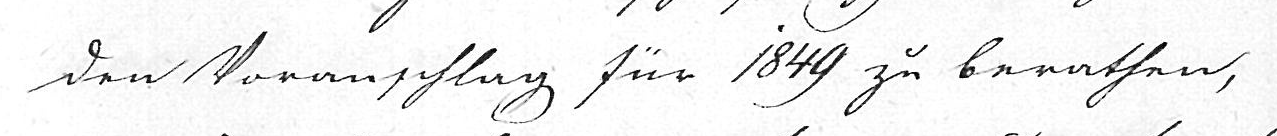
den Voranschlag für 1849 zu berathen,
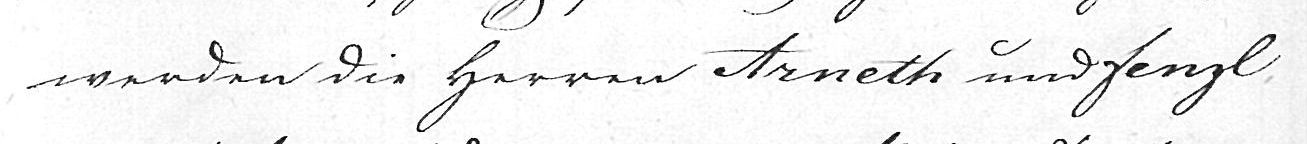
werden die Herren Arneth und Fenzl
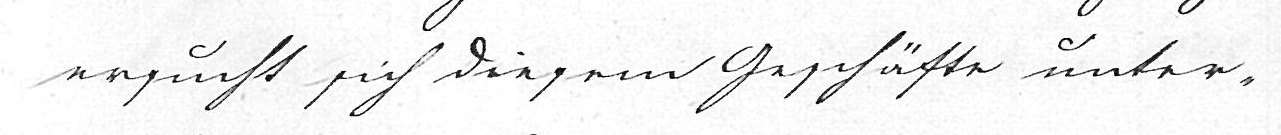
ersucht sich diesem Geschäfte unter-
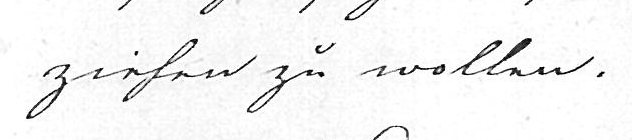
ziehen zu wollen.
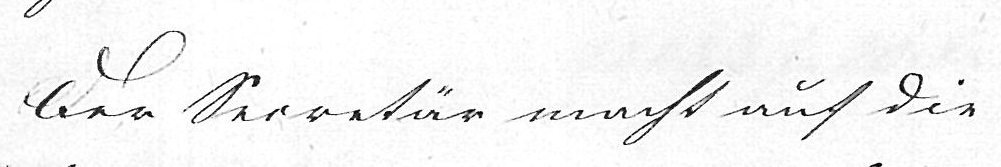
Der Secretär macht auf die
